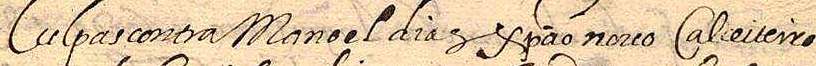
Culpas contra Manoel diaz Xpão nouo Calceiteiro
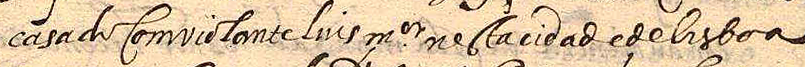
casado Com violante luis mor nesta cidade de lisboa
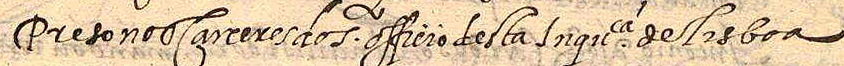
Preso nos Carceres do s.to officio desta Inqu.cā de lisboa
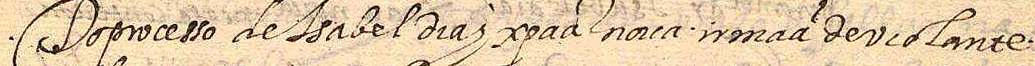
Do processo de Isabel diaz xpaā noua irmaā de violante
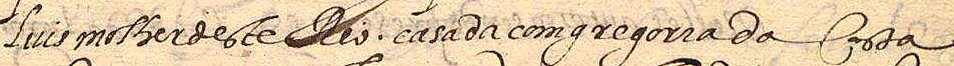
luis molher deste Reo. casada com gregoria da Costa
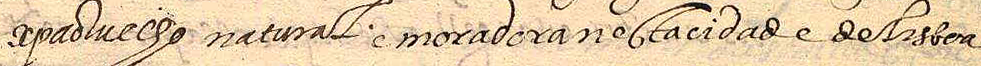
xpaõ uelho natural e moradora nesta cidade de lisboa
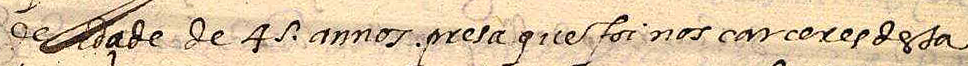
de idade de 45. annos presa que foi nos carceres desta
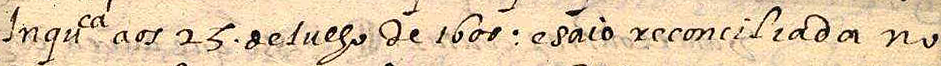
Inqucā aos 23. de Iulho de I6oo: e saio reconciliada no
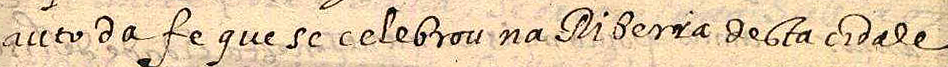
auto da fe que se celebrou na Riberia desta cidade
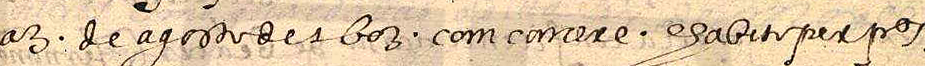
a 3. de agosto de i6o3. com carcere. e habito perpos.
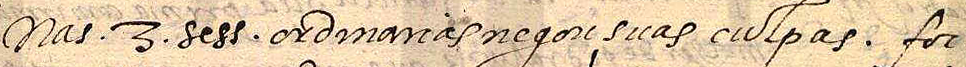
nas .3. sess. ordinarias negou suas culpas. foi
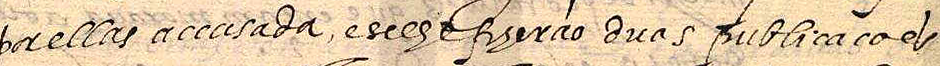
por ellas accusada, e se lhe fizerão duas publicacoẽs
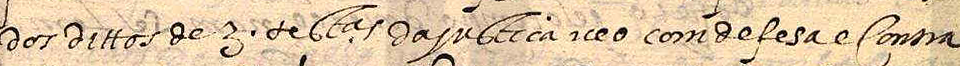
dos dittos de 3. testas da justica ueo com defesa e Contra
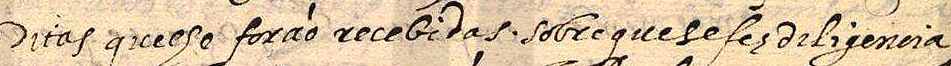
ditas que lhe foraõ recebidas. sobre que se fez diligencia
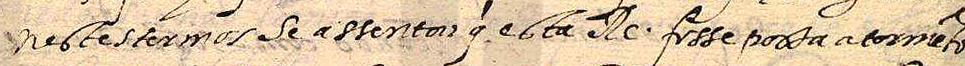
nestes termos se assentou q̄ esta Re. fosse posta a tormēto
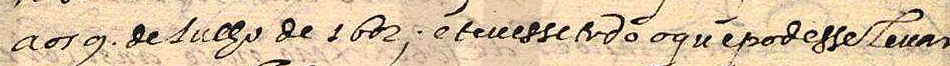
aos 9. de Iulho de I6o2; e teuesse tudo o que podesse leuar
